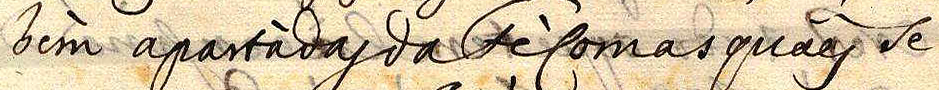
bem apartadas da Fè Com as quaes se
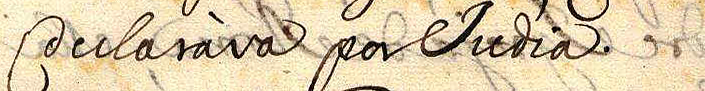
declarava por Iudia.
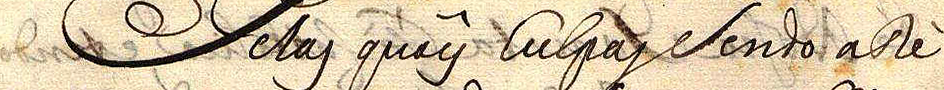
Pelas quaes Culpas Sendo a Rè
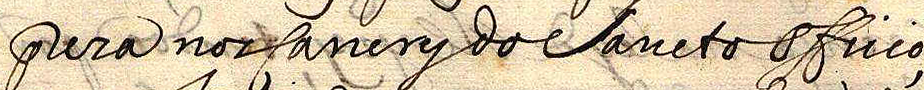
preza noz Carceres do Sancto Officio,
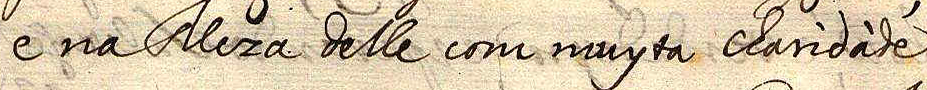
e na Meza delle com muyta charidàde
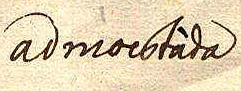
admoestàda
